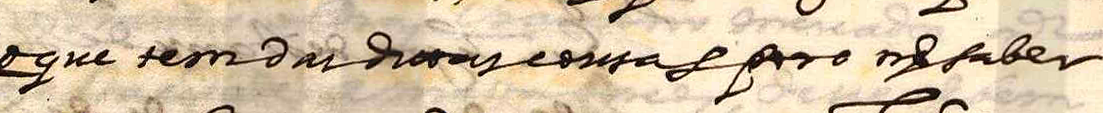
o que tem das dittas cousas por o não saber
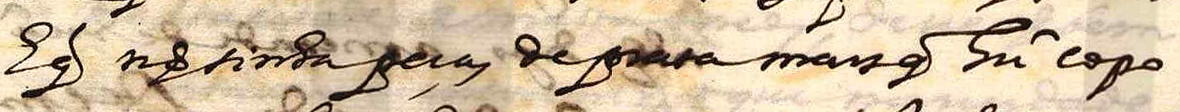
E q̄ não tinha peças de prata mais q̄ hū copo
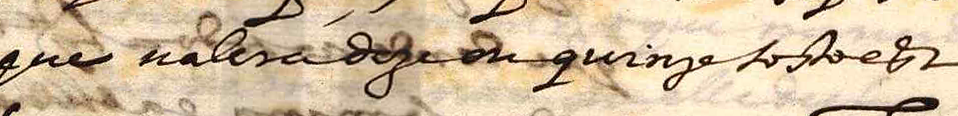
que ualera doze ou quinze tostoes
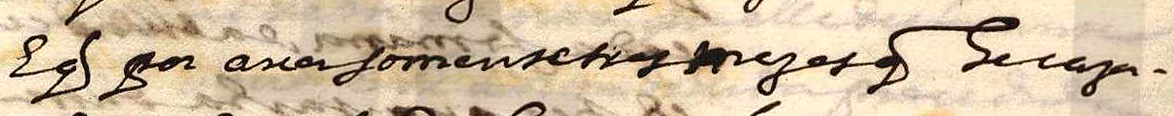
E q̄ por auer somente tres mezes q̄ he caza
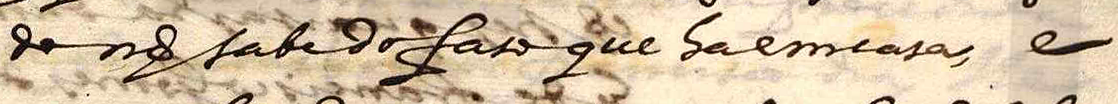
do não sabe do fato que ha em casa, e
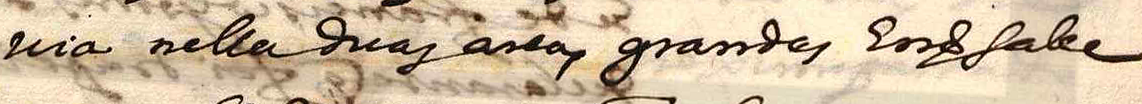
uia nella duas arcas grandes E não sabe
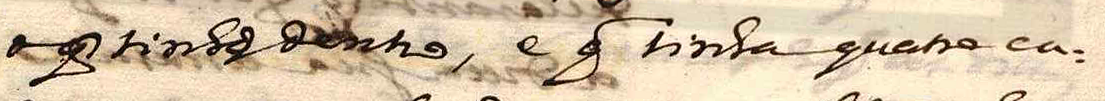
o q̄ tinhão dentro, e q̄ tinha quatro ca
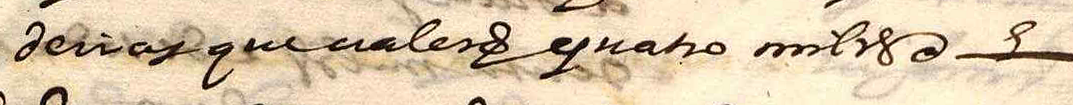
deiras que ualerão quatro mil rs
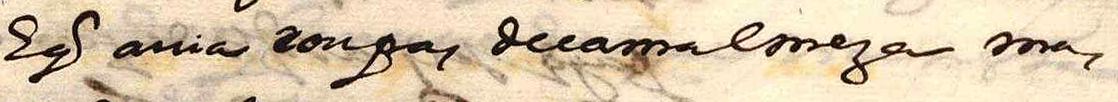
E q̄ auia roupas de cama e meza mas
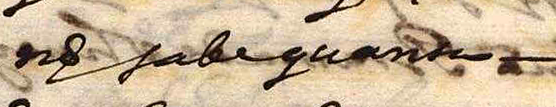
não sabe quanta
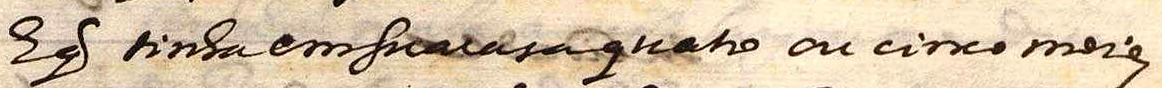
E q̄ tinha em sua casa quatro ou cinco moios
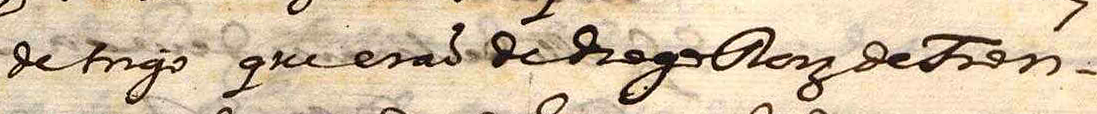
de trigo que eraõ de diogo Roiz de Fron
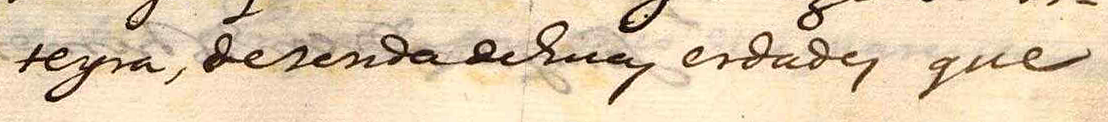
teyra, de renda de huas erdades que
